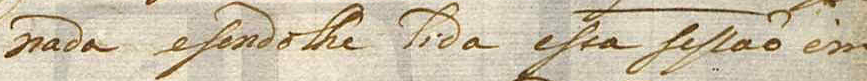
nada e sendolhe lida essa sessaõ em
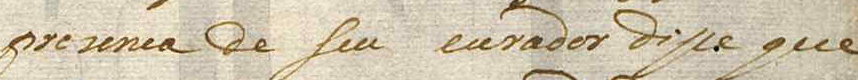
prezenca de seu curador disse que
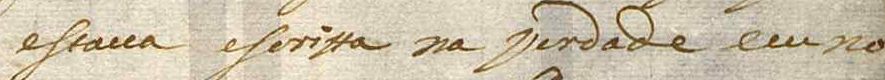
estaua escritta na Verdade e eu no
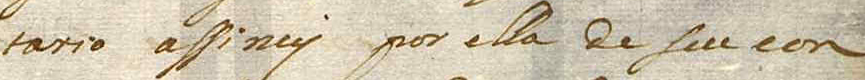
tario assiney por ella de seu con
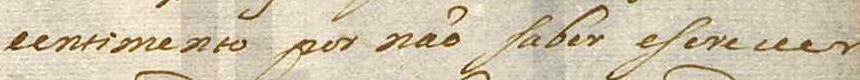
centimento por naõ saber escreuer
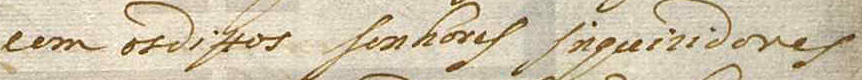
com os dittos senhores jnquizidores
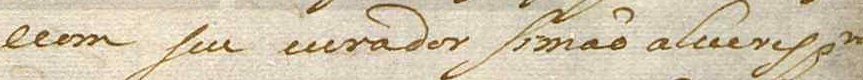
e com seu curador simaõ alueres pra
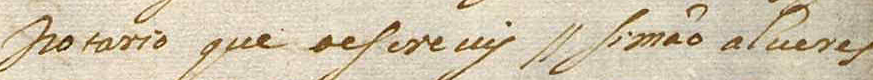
Notario que o escrevy // simaõ alueres
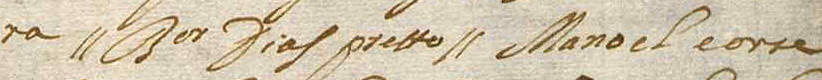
pra // Bar Dias pretto // Manoel corte
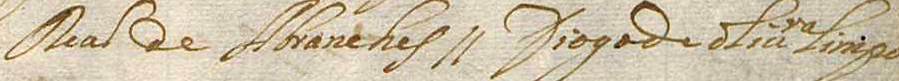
Real de Abranches // Diogo de oliura Limpo
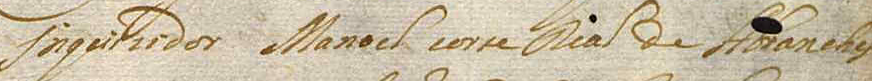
Jnquizidor Manoel corte Real de Abranches
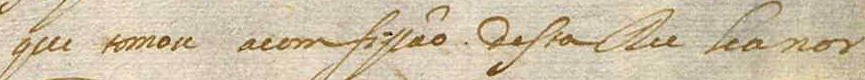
que tomou a comfissaõ desta Ree Leanor
